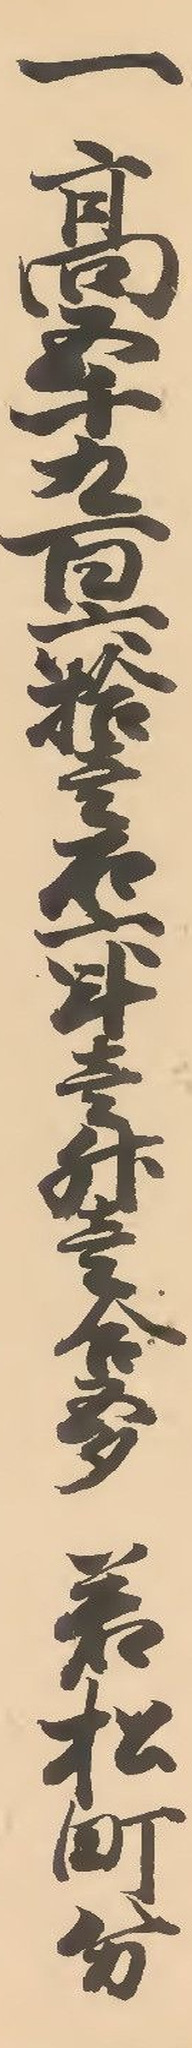一高五千九百六拾壱石六斗壱升壱合五勺若松町分
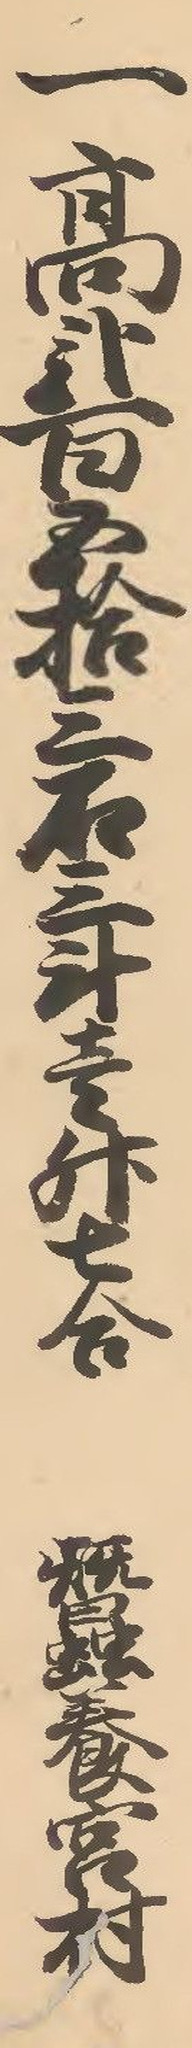一高弐百五拾三石三斗壱升七合蚕養宮村

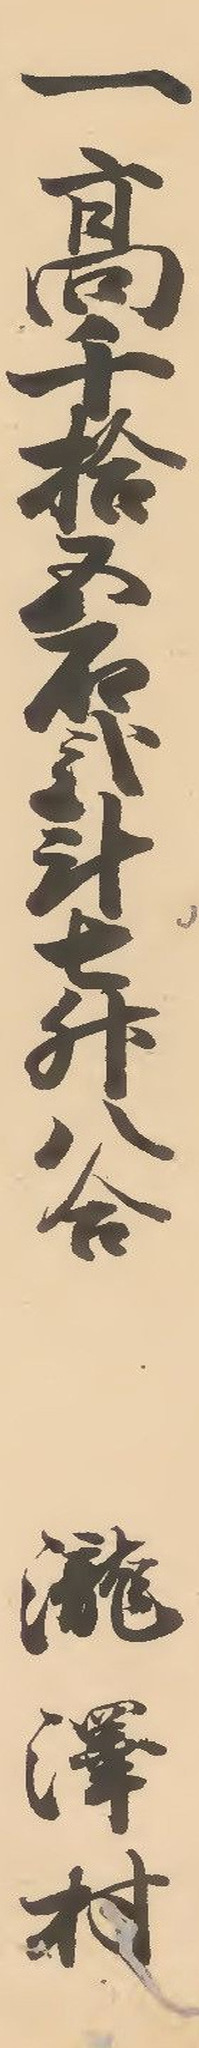一高千拾五石弐斗七升八合滝沢村
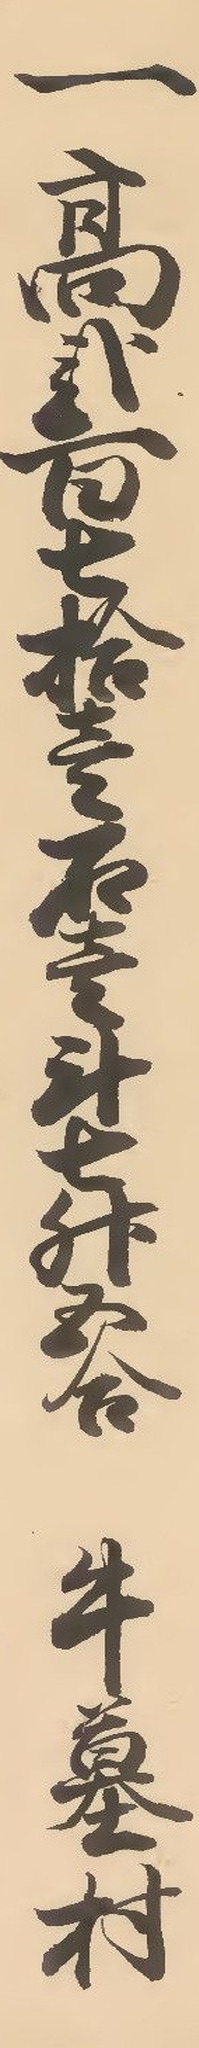一高弐百七拾壱石壱斗七升五合牛墓村
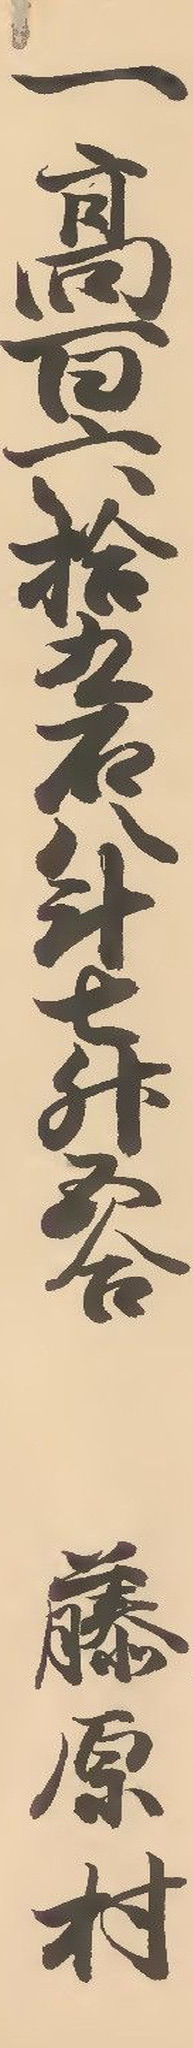一高百六拾九石八斗七升五合藤原村
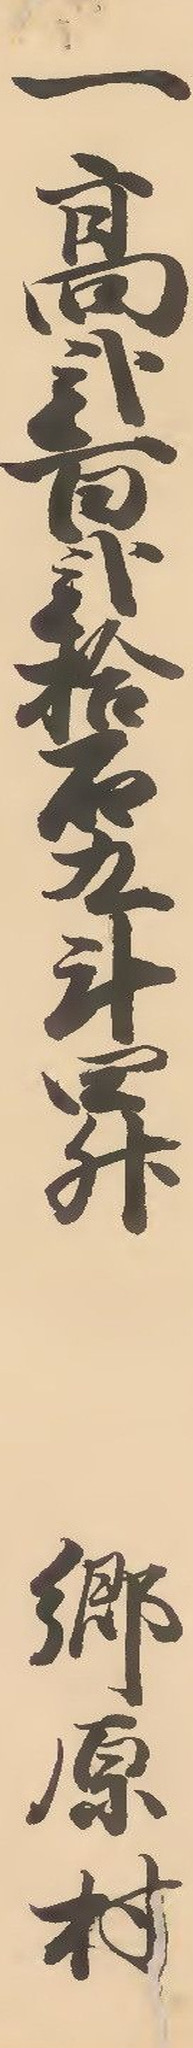一高弐百弐拾石九斗四升郷原村
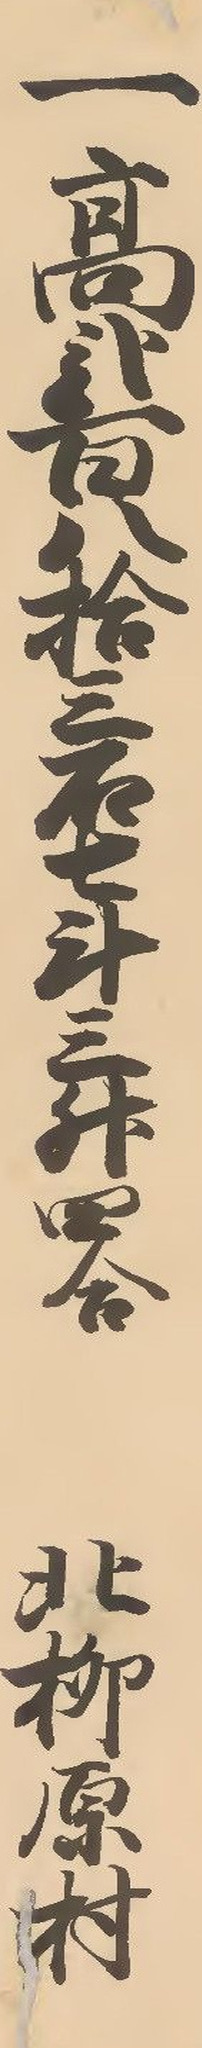一高弐百八拾三石七斗三升四合北柳原村
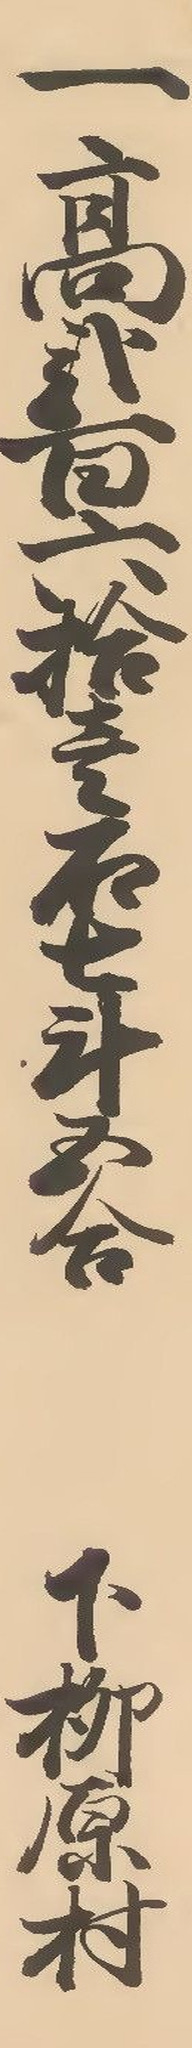一高弐百六拾壱石七斗五合下柳原村
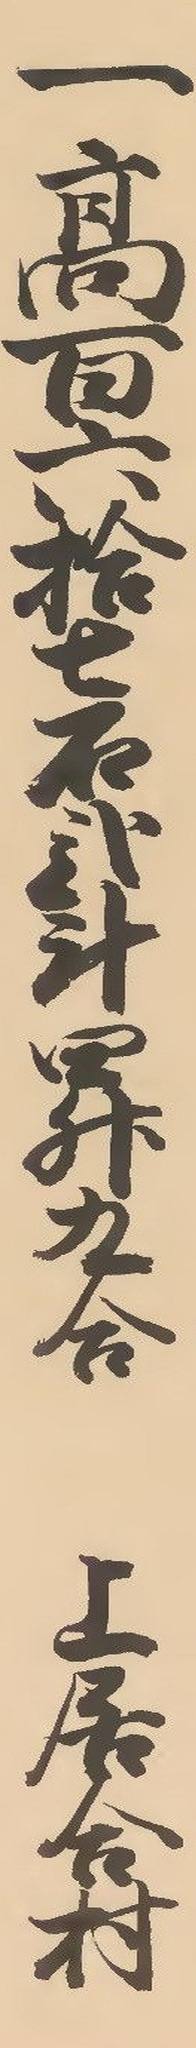一高百六拾七石弐斗四升九合上居合村
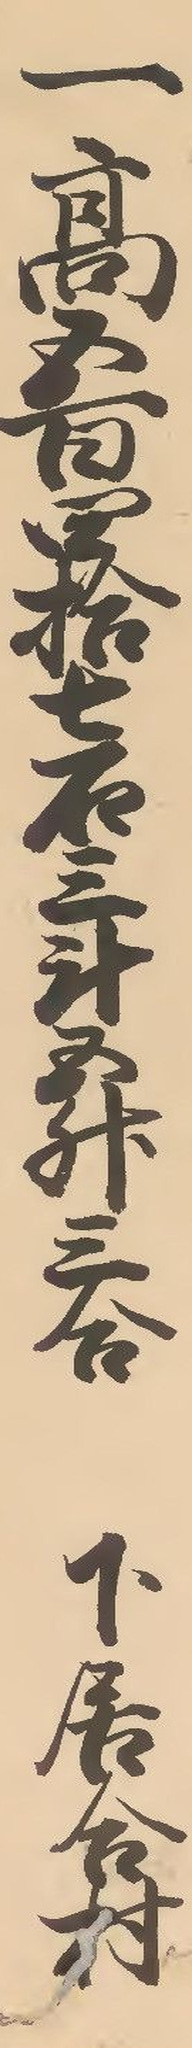一高五百四拾七石三斗五升三合下居合付

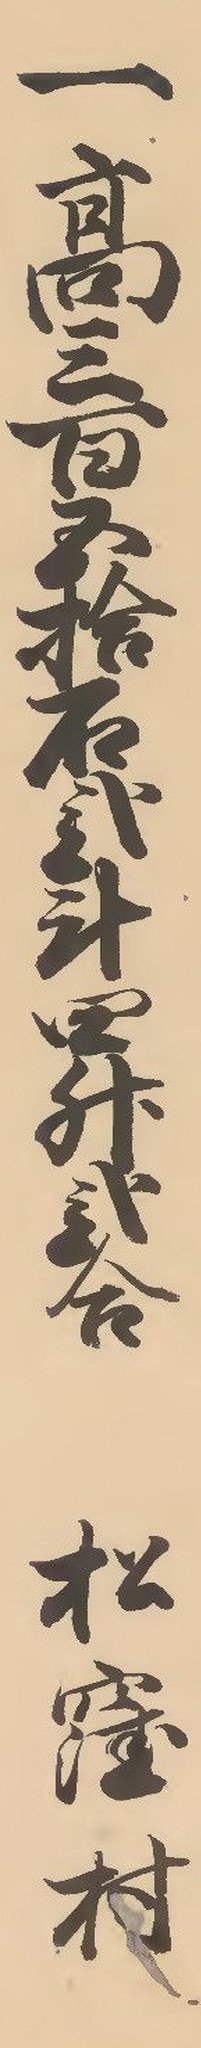一高三百五拾石弐斗四升弐合松窪村
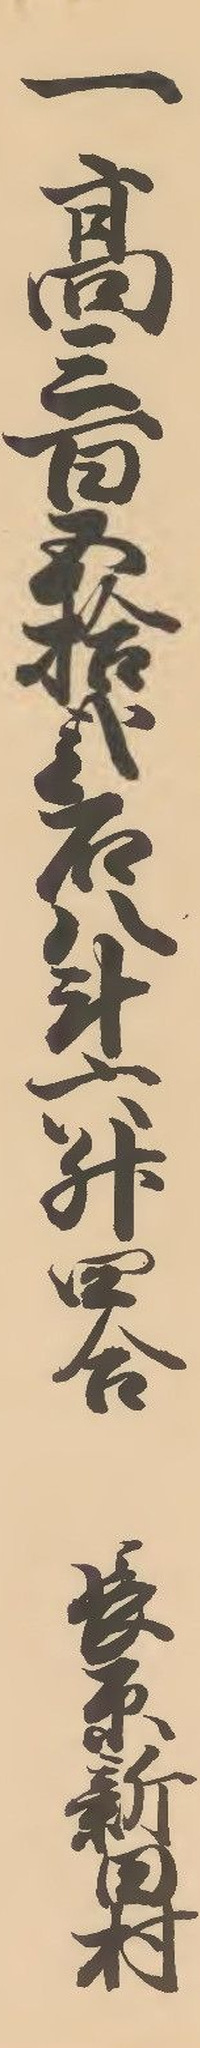一高三百五拾弐石八斗六升四合長原新田村
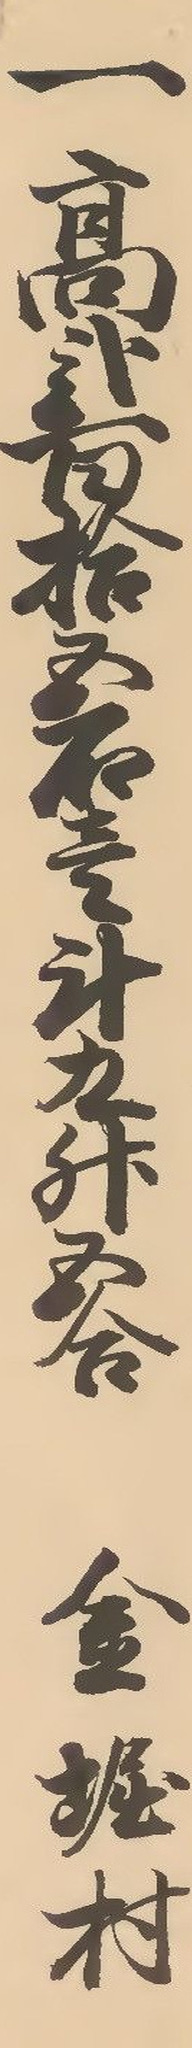一高弐百拾五石壱斗九升五合金堀村
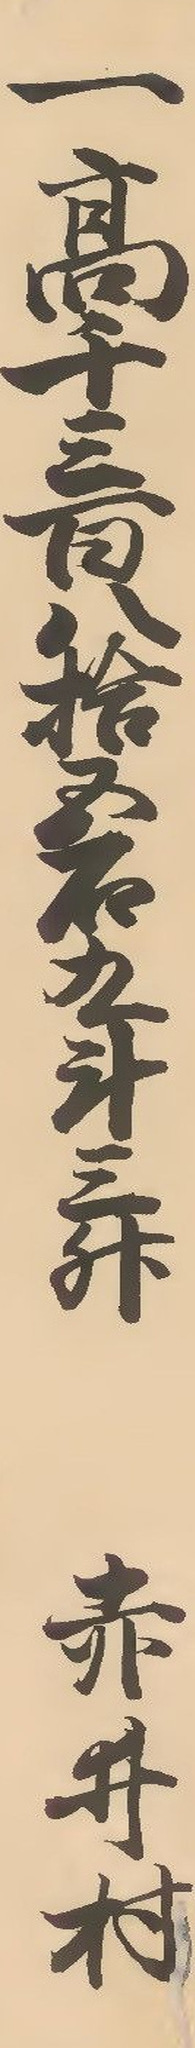一高千三百八拾五石九斗三升赤井村
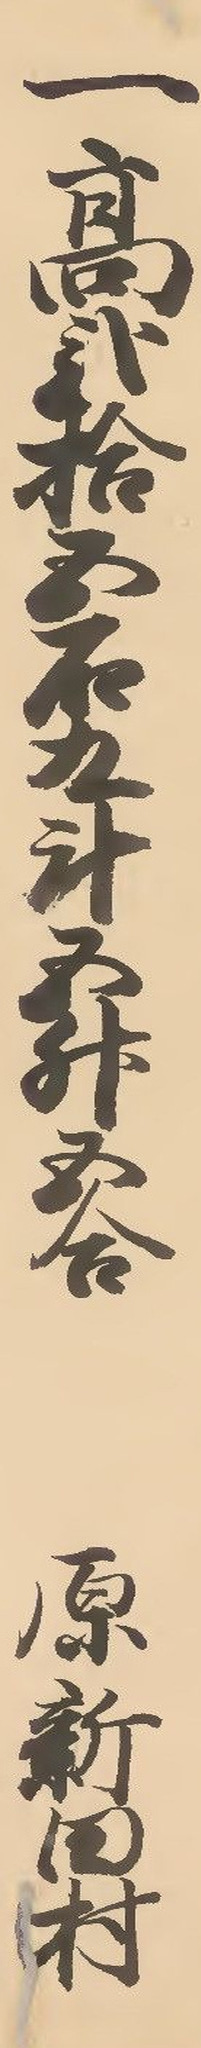一高弐拾五石九斗五升五合原新田村
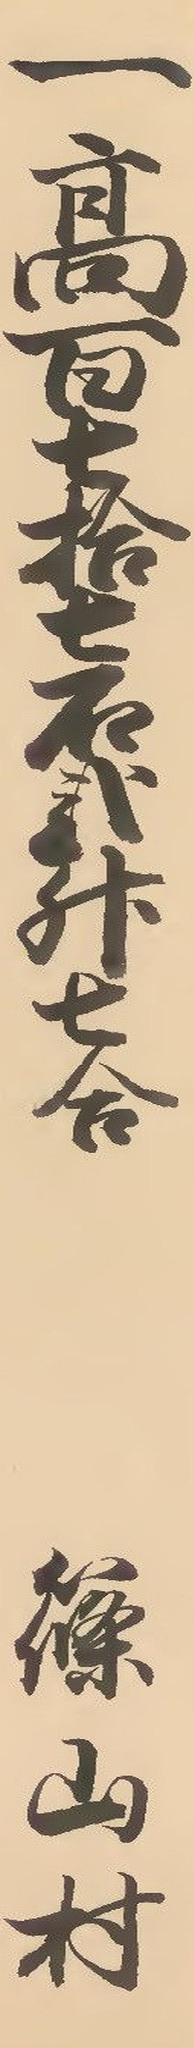一高百七拾七石弐升七合篠山村
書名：陸奥国郷帳　１
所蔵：国立公文書館 National Archives of Japan
